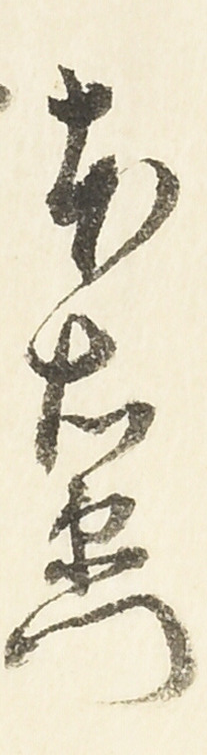与右衛門
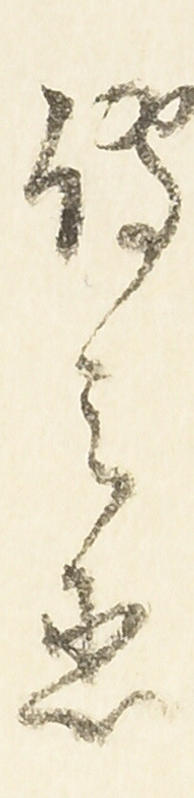伝之丞
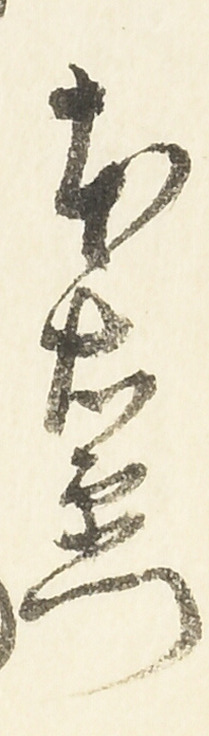与右衛門
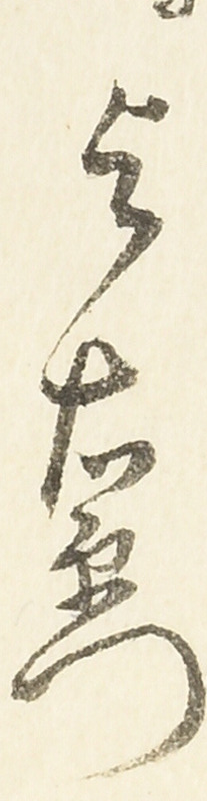与右衛門
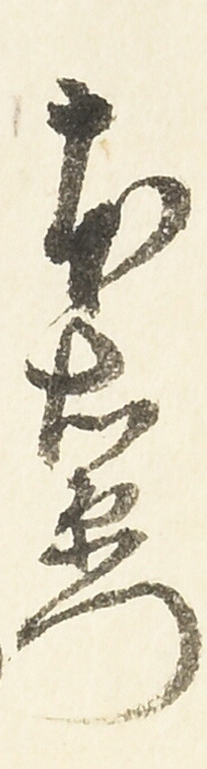与右衛門
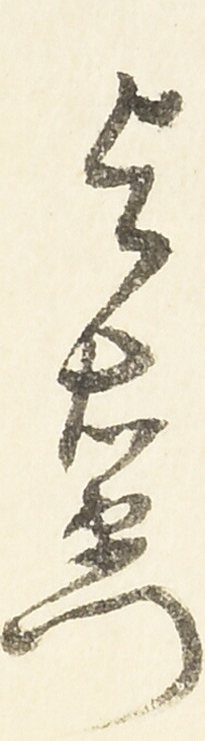与右衛門
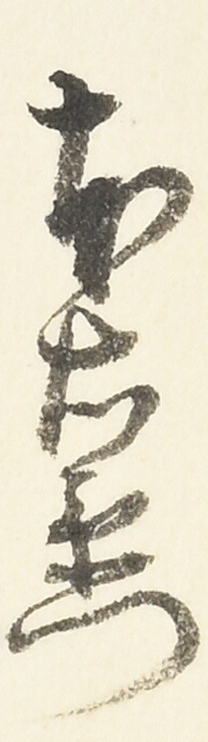与右衛門
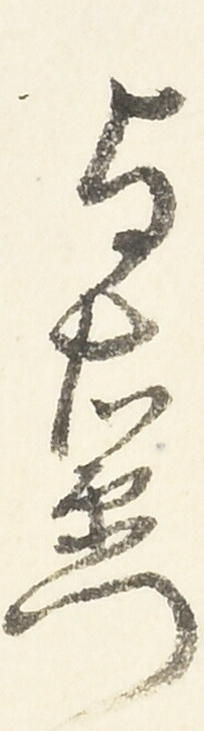与右衛門
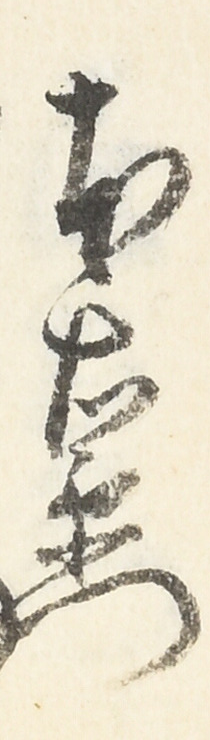与右衛門
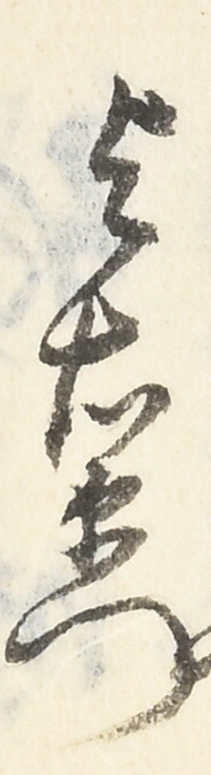与右衛門
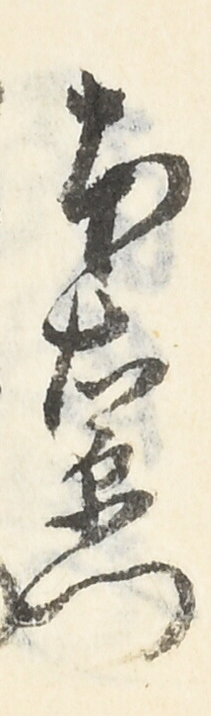与右衛門
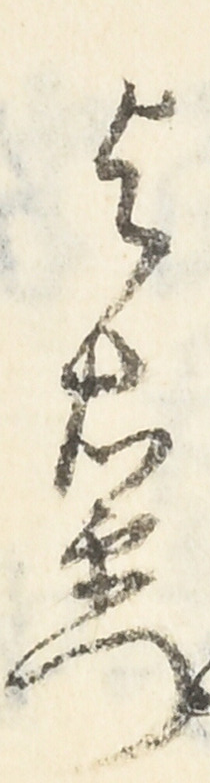与右衛門

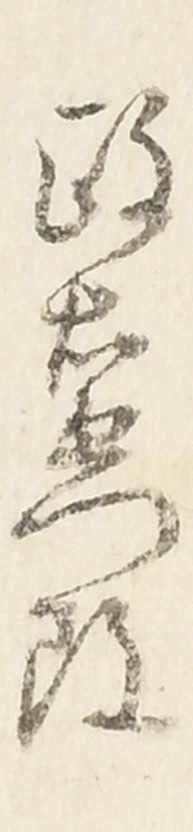政右衛門改
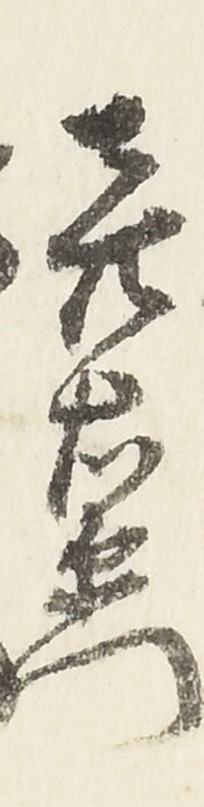民右衛門
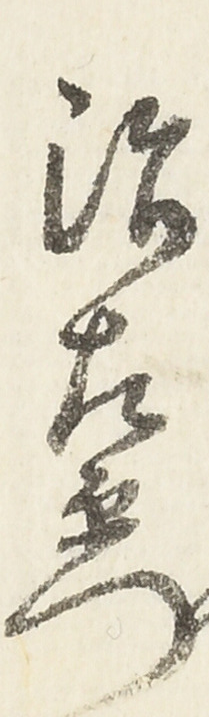治左衛門
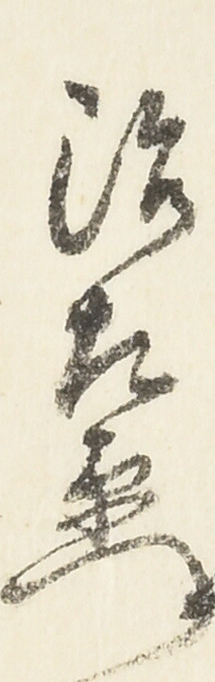治左衛門
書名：鉾持町丁代勤役年歴順控
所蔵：伊那市立高遠町図書館・合同会社AMANE
